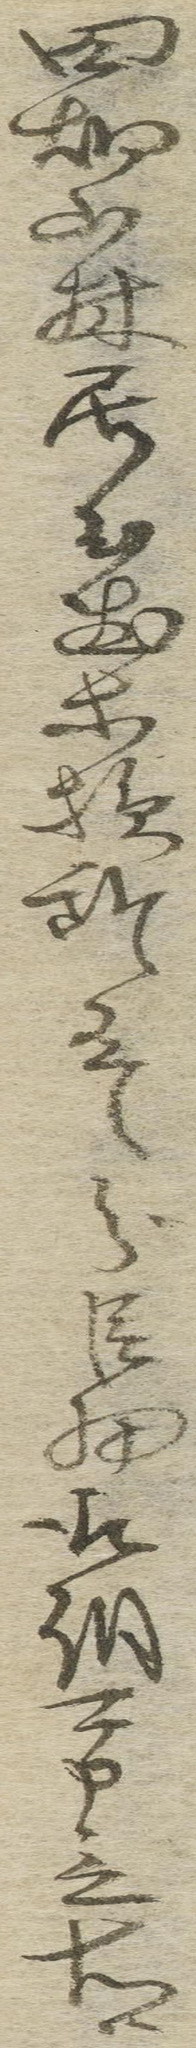田畑山林居屋敷等損所有之分巨細取調可申立右ハ

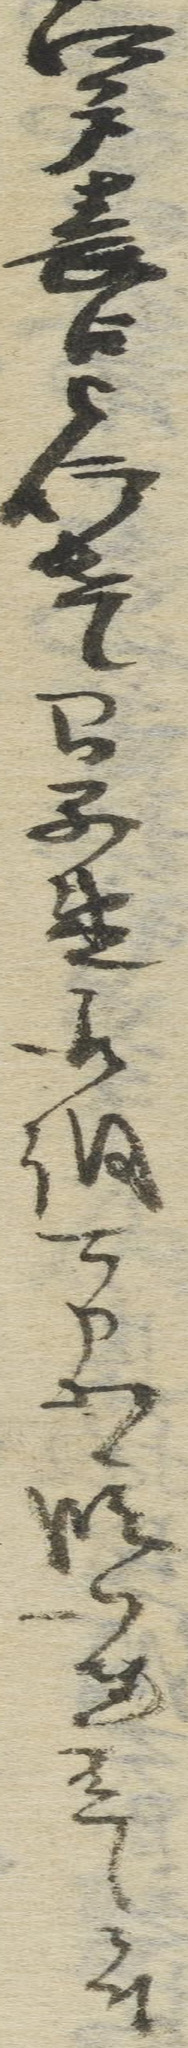江戸表ゟ被仰遣候間早速取調可申出候段御達有之候二付
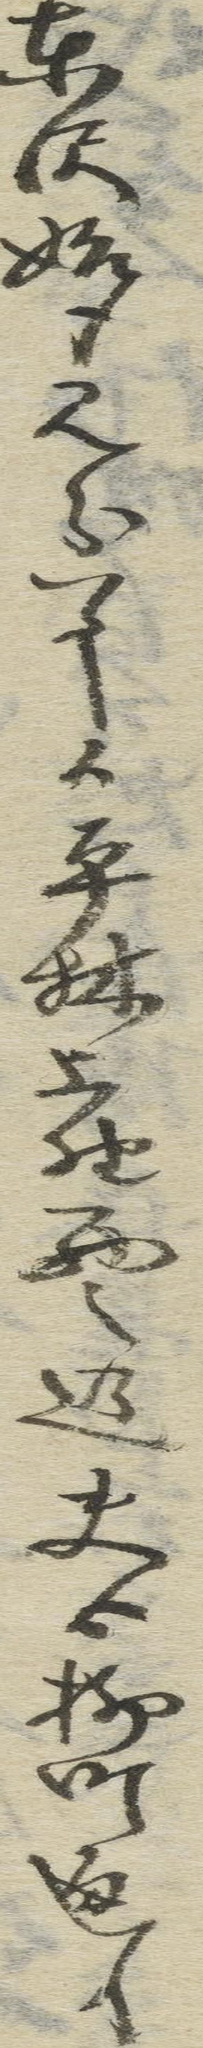東沢始メ見分いたし候平林上野西之辺夫ゟ柳町通り
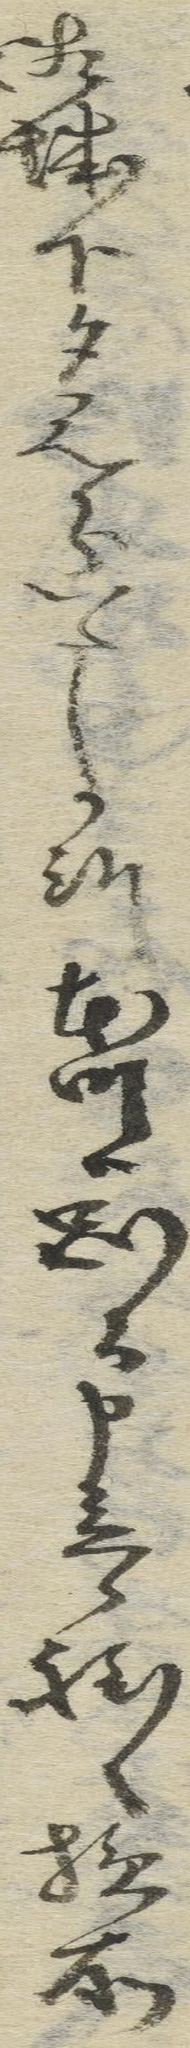御城下タ見分いたし候所本町ハ別而申立候程之損所
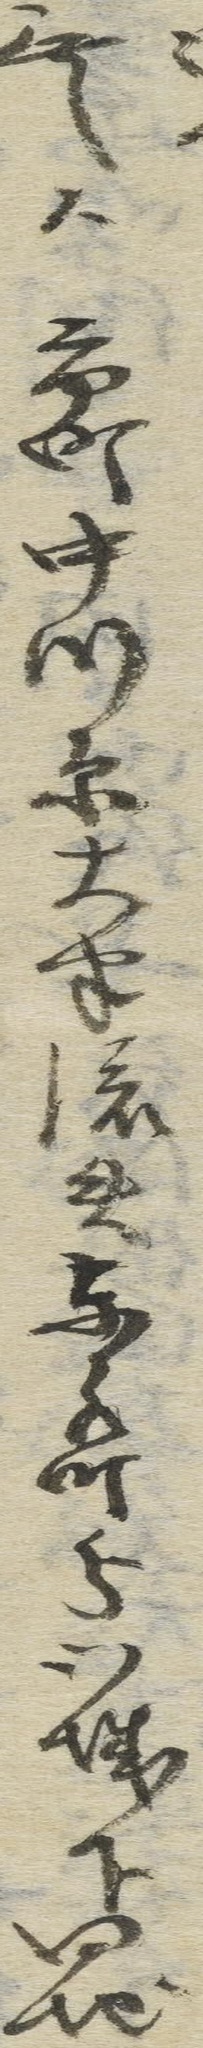無之候市町中河原大半流失与良町分御城下田地
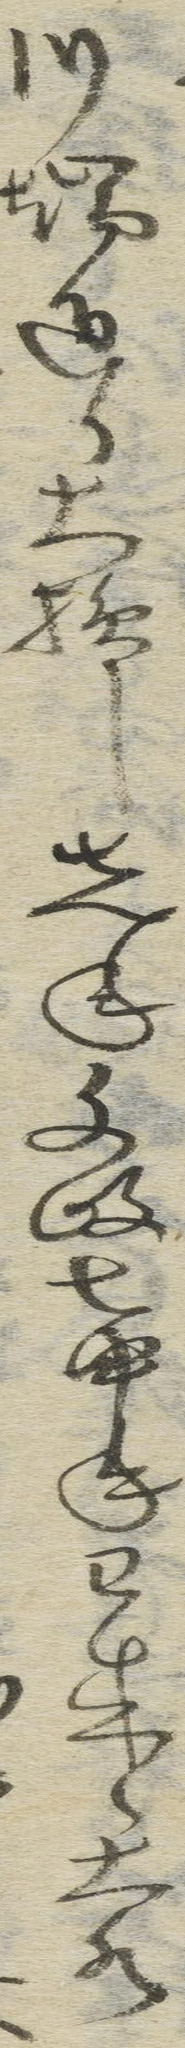川端通り大損し先年文政七申年巳来之大水
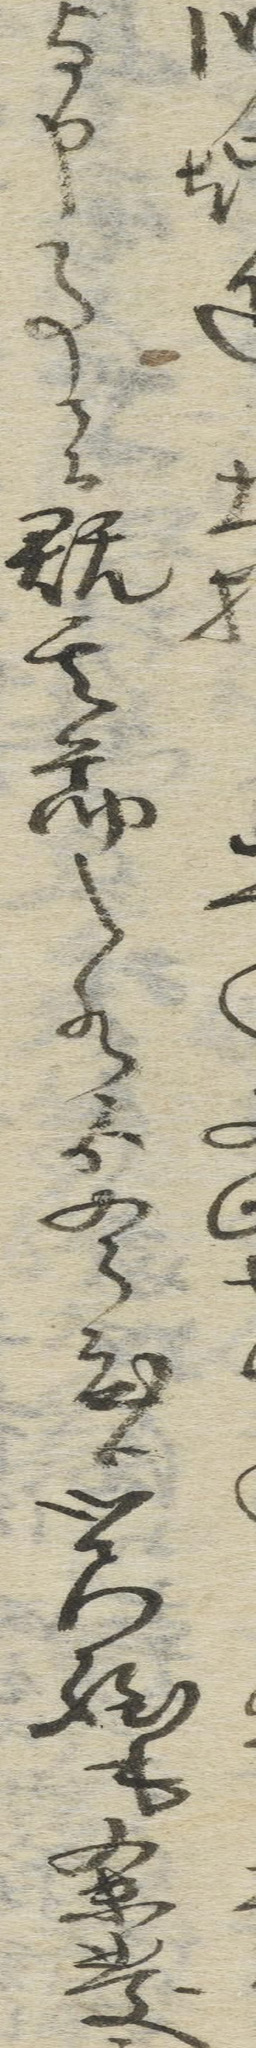と申事二而既其前之水ゟ今度ハ弐尺程も余慶二
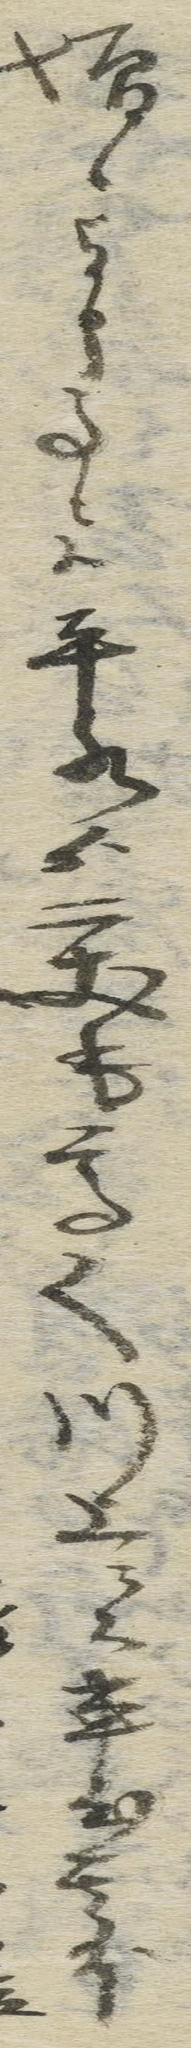増候と申事二候平水ゟ二丈も高く川上二而車屋其外
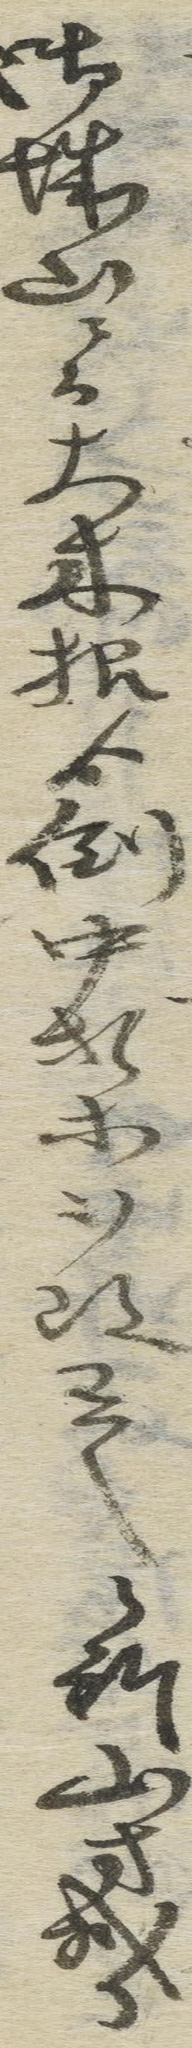御城山二而大木根ゟ倒中折木御改有之候所山方成候
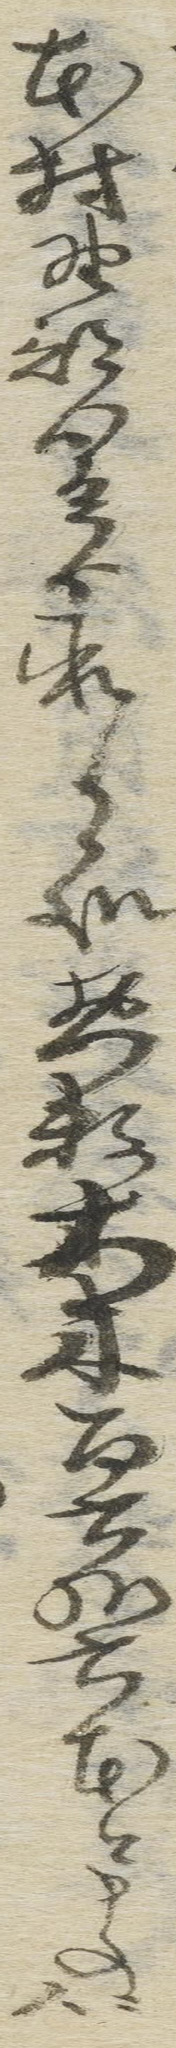本村野部右衛門殿ゟ承候処惣数大木百六拾六本と申事二候
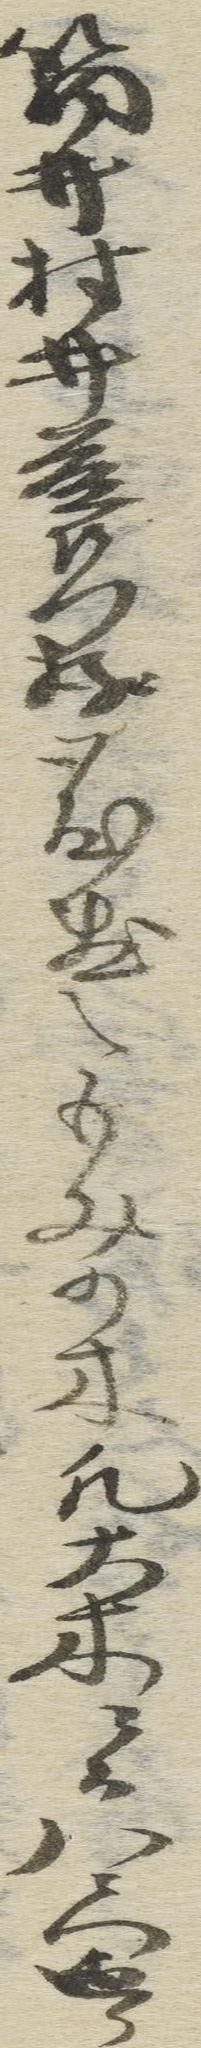筒井村井藤右衛門様御屋敷之もみの木凡大木二而八尺廻り
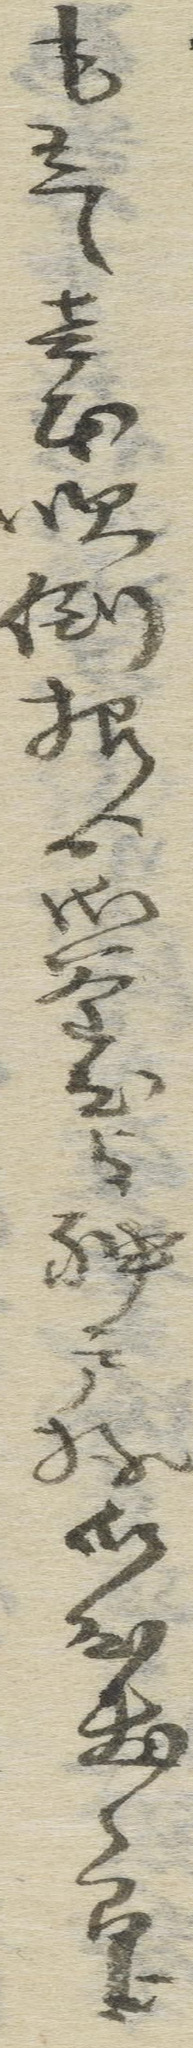も有之壱本吹倒根ゟ御となり神戸様御屋敷之間江
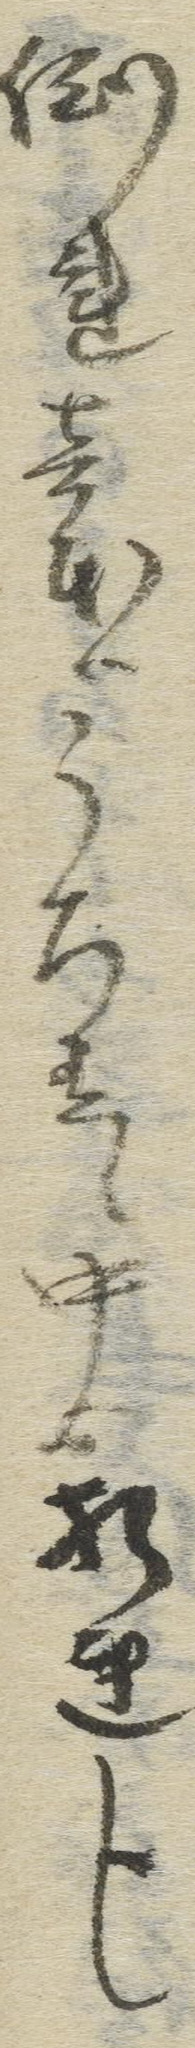倒れ壱本ハくち有之中ゟ折れ申候
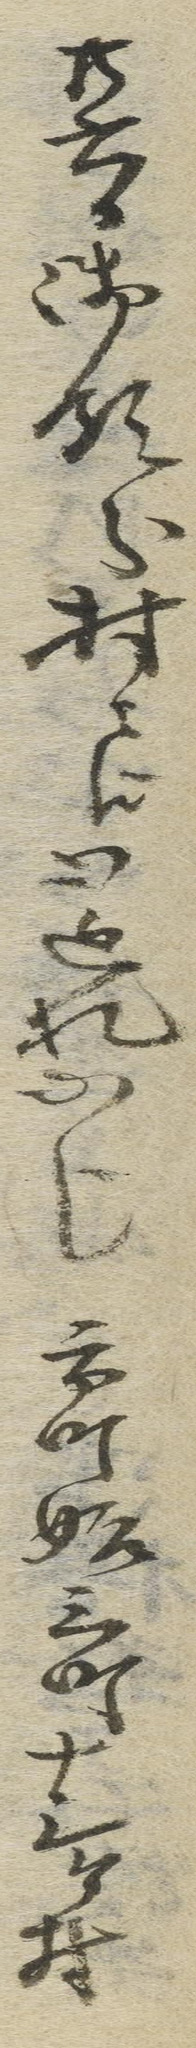廿六日御領分村々江御廻札出申候市町三町外十三ヶ村
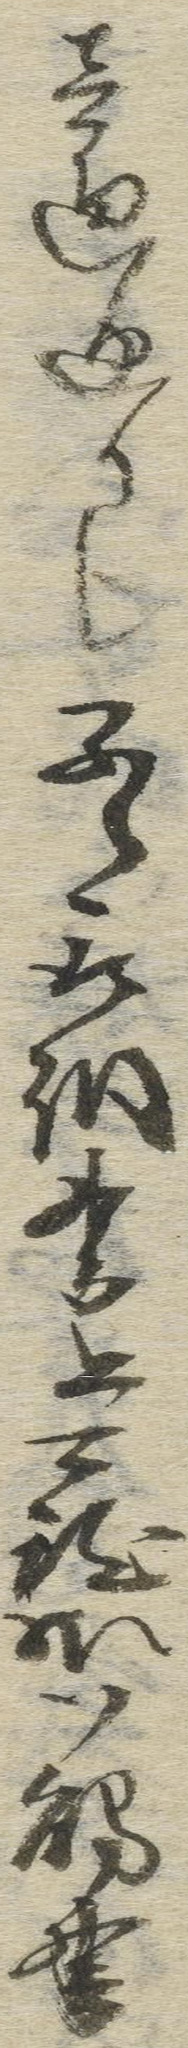壱通廻り申候草々取調書上可致様御触書
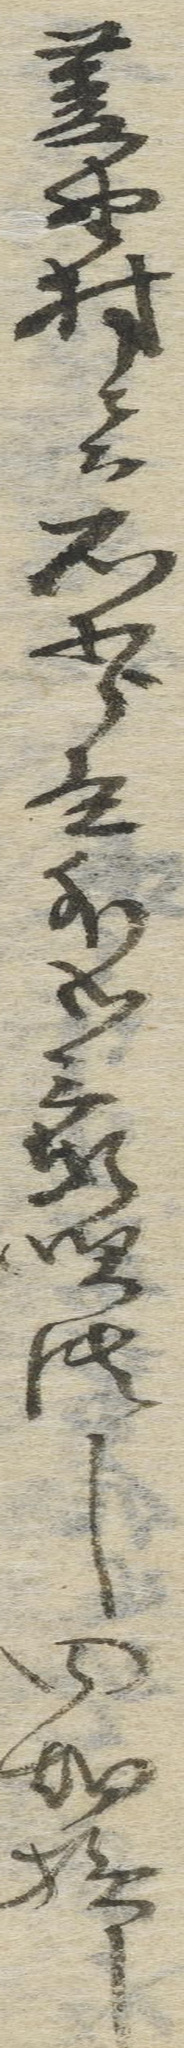菱野村二而石五郎殿外弐三軒吹潰し田地損し
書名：信濃越後　地震書留
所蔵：東京大学地震研究所図書室 Earthquake Research Institute Library, The University of Tokyo, JAPAN
